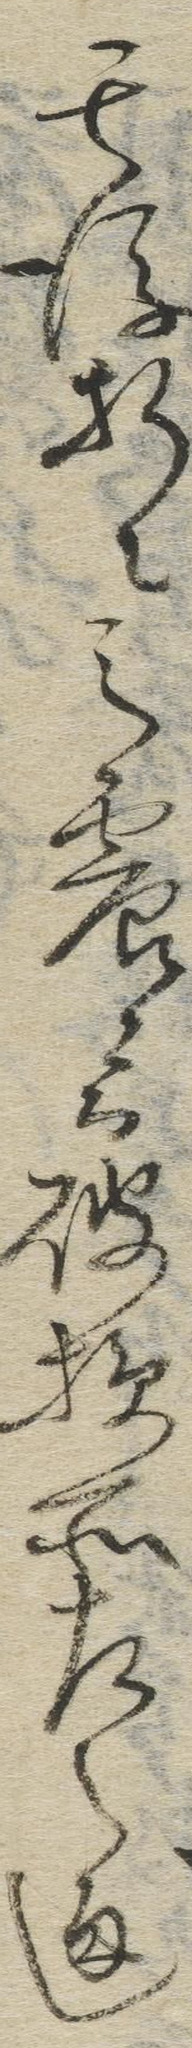其後折々之震二而破損所左之通
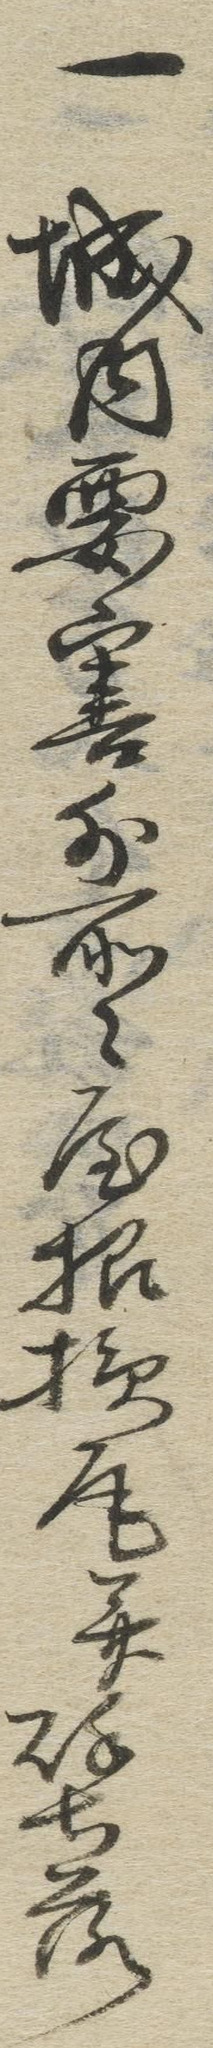一城内要害外所々屋根損瓦幷壁落
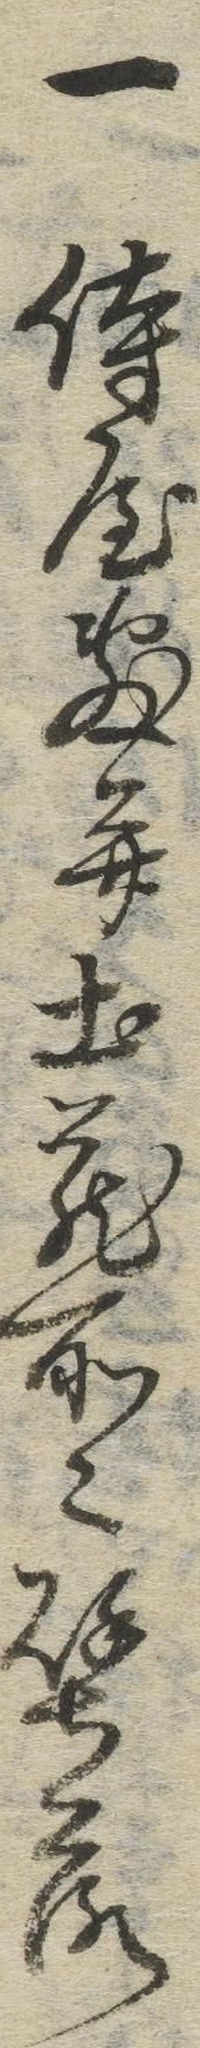一侍屋敷幷土蔵所々壁落
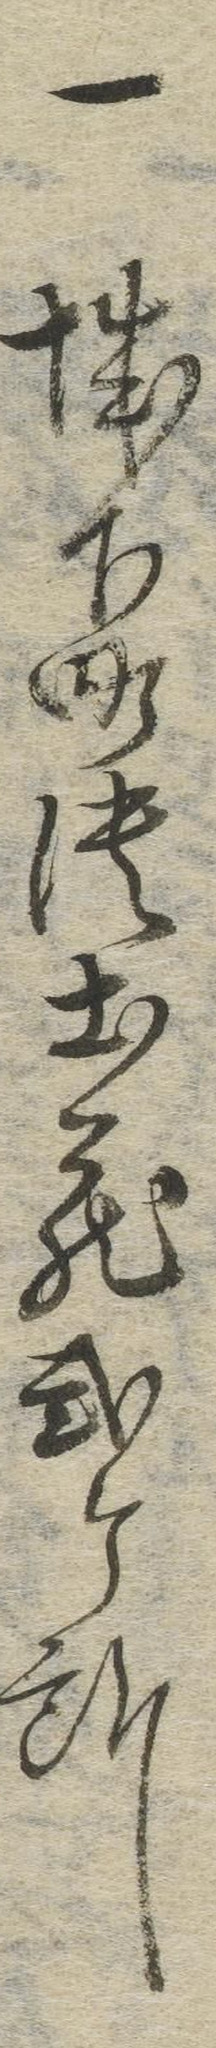一城下町潰土蔵弐ヶ所
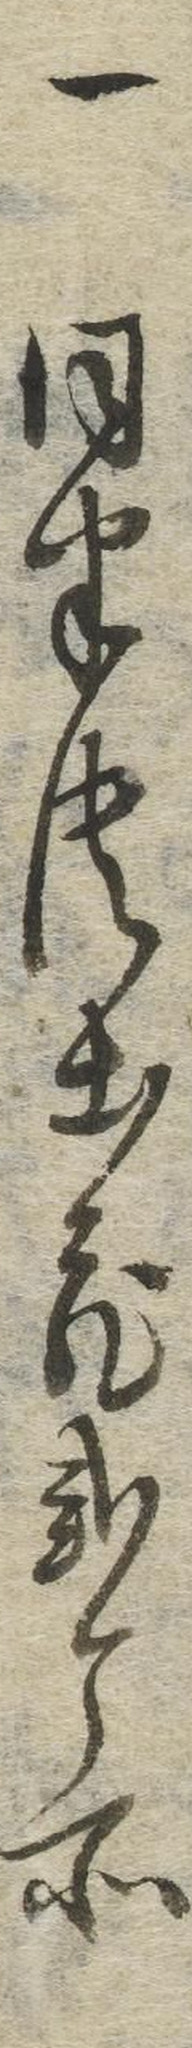一同半潰土蔵弐ヶ所
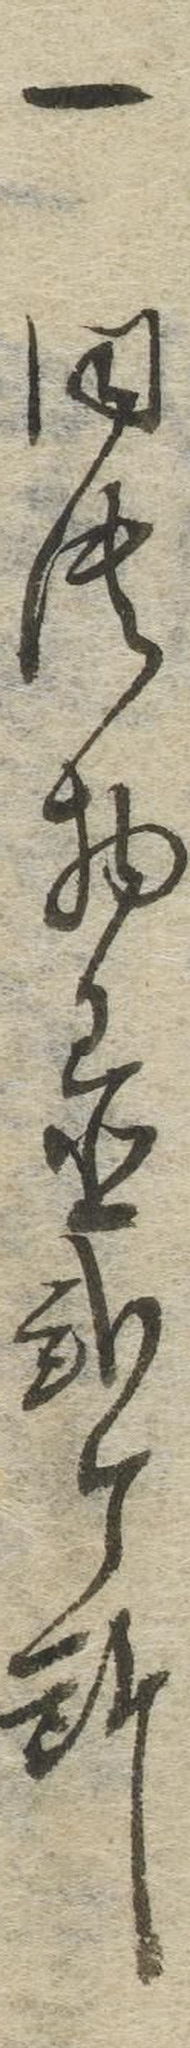一同潰物置弐ヶ所

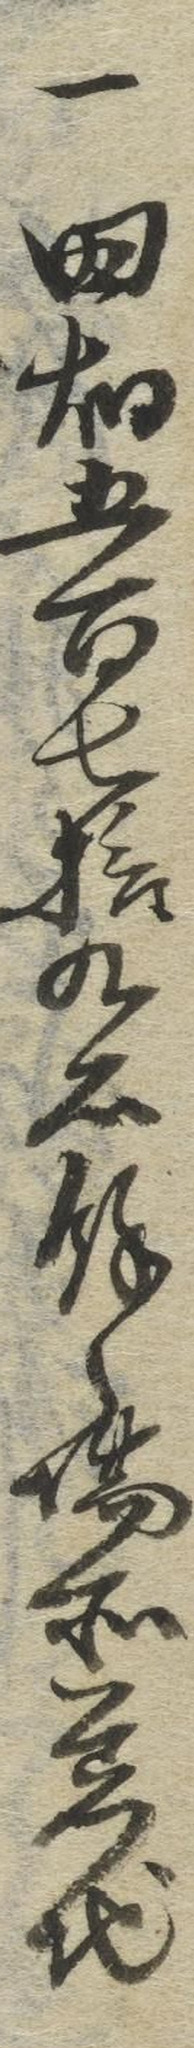一田畑五百七拾九石餘之場所荒地
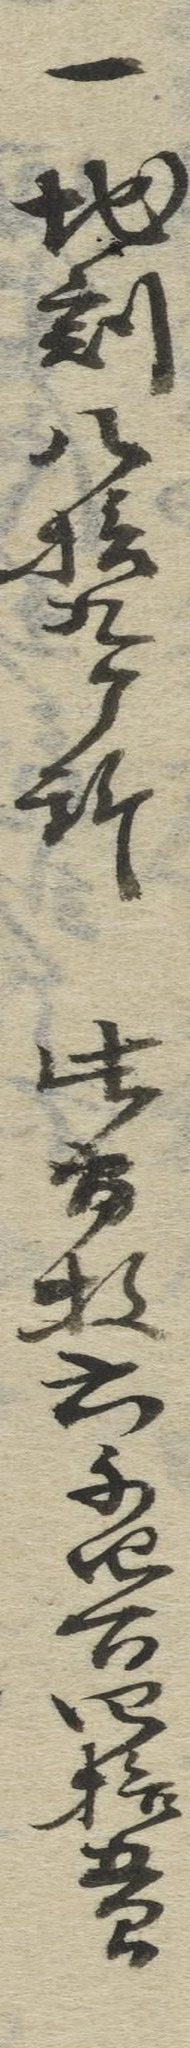一地割八拾九ヶ所此間数六千四百四拾五間
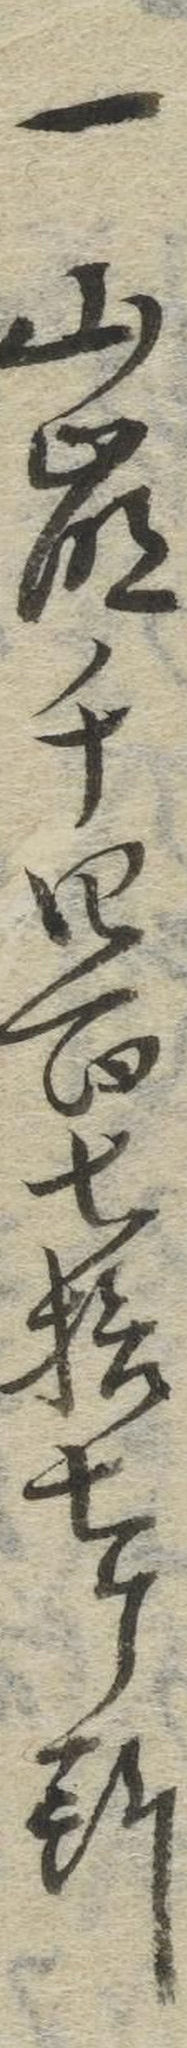一山崩千四百七拾七ヶ所
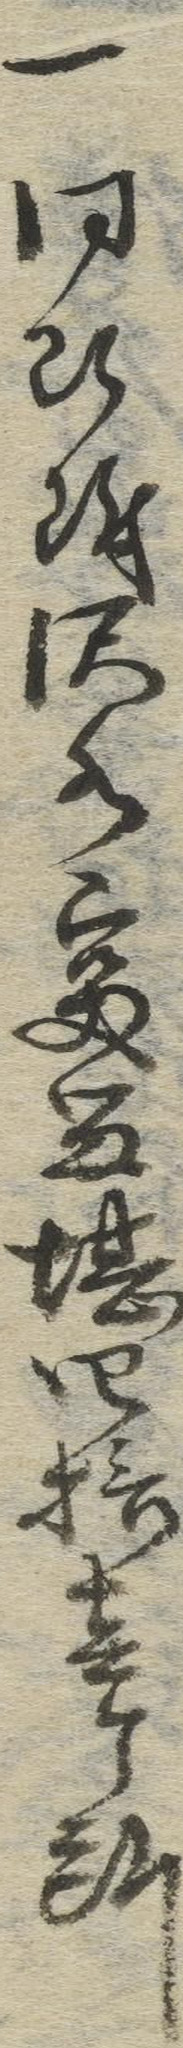一同断附沢水突留場四拾壱ヶ所
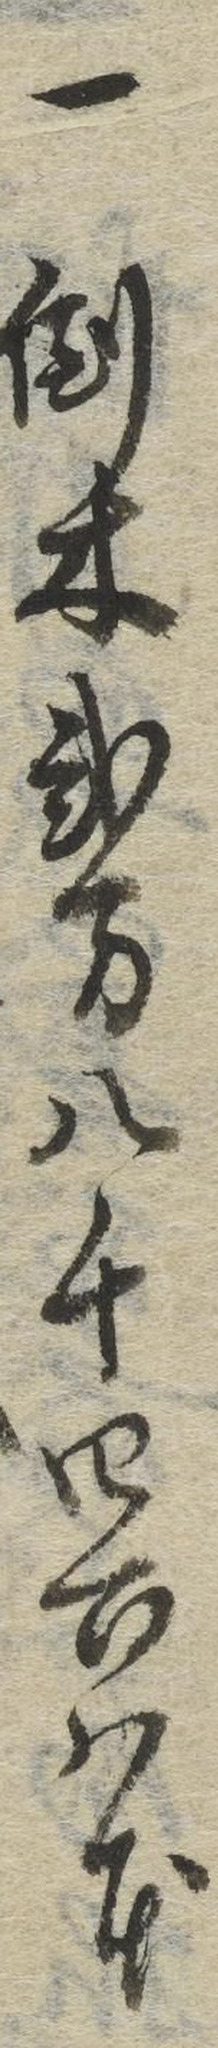一倒木弐万八千四百八本
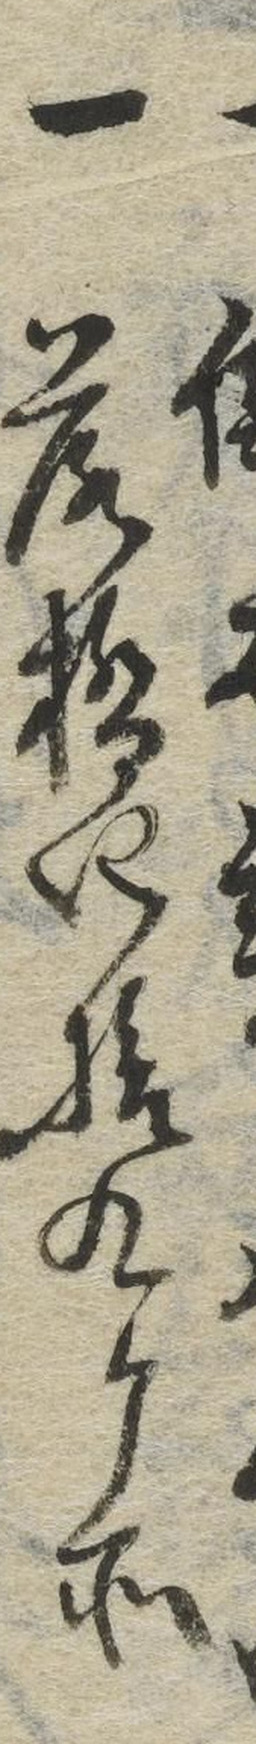一落橋四拾九ヶ所
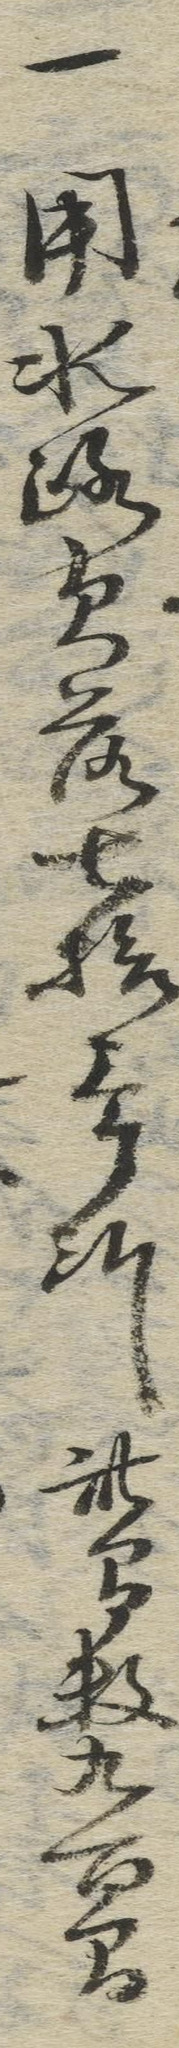一用水路欠落七拾三ヶ所此間数九百間
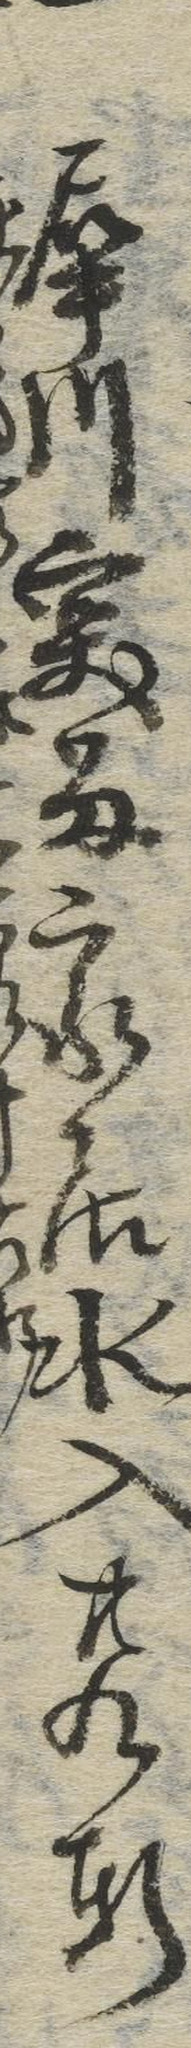一犀川突留家居水入廿九軒
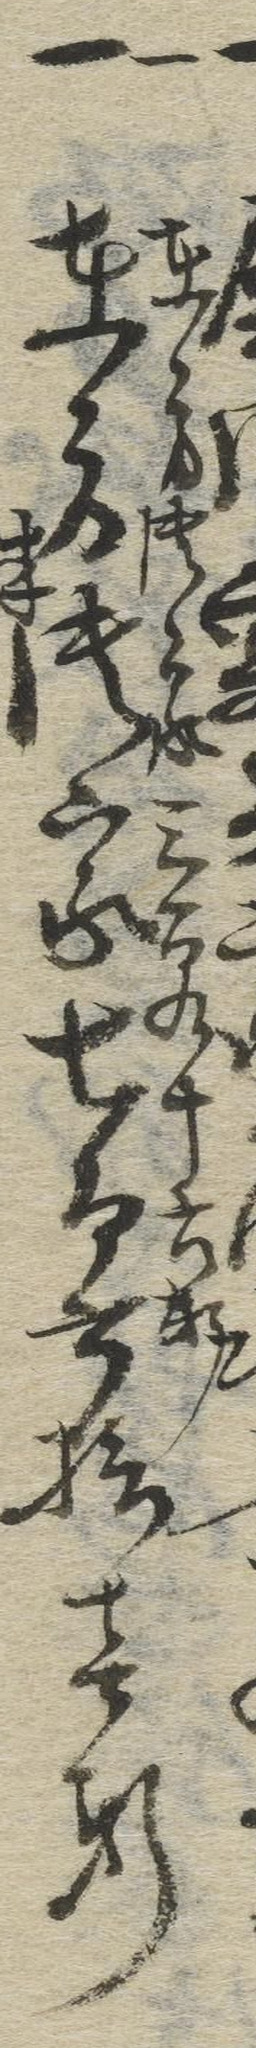一在方半潰家七百六拾壱軒
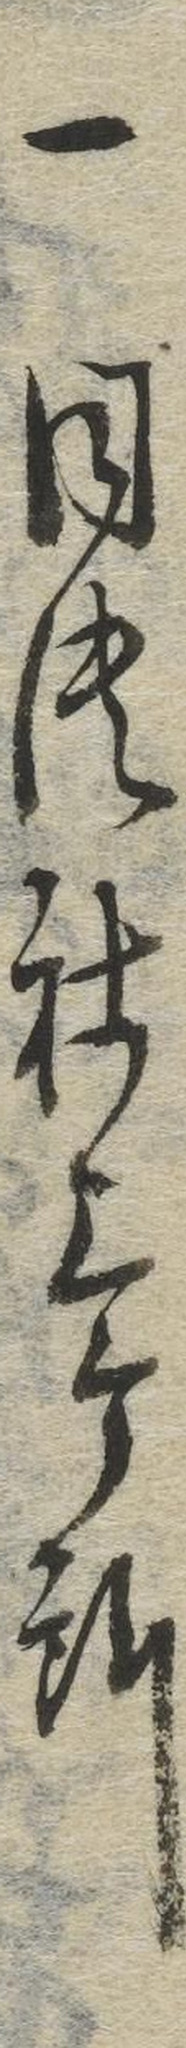一同潰社三ヶ所
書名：信濃越後　地震書留
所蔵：東京大学地震研究所図書室 Earthquake Research Institute Library, The University of Tokyo, JAPAN
